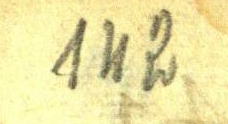142
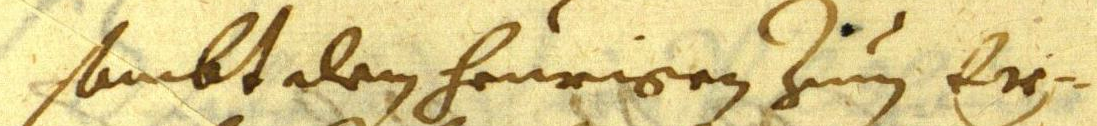sambt den heūrigen Zūm Er¬
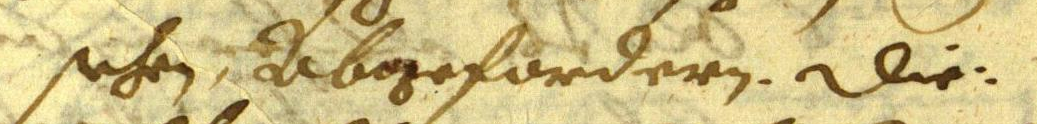sehen, Abzefordern. die¬
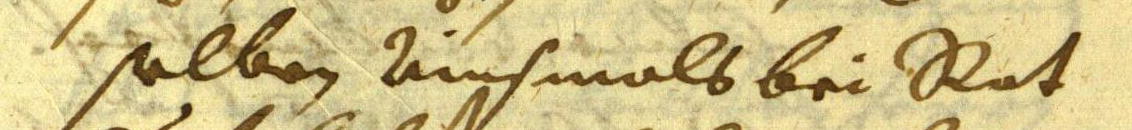selben Ainsmals bei Rat
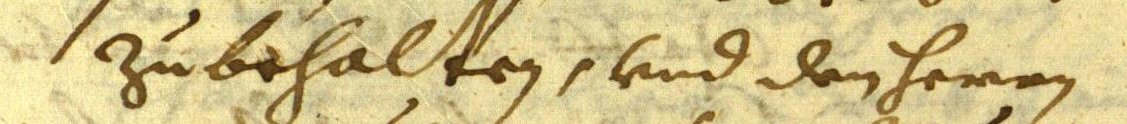zū behalten, vnd den herrn
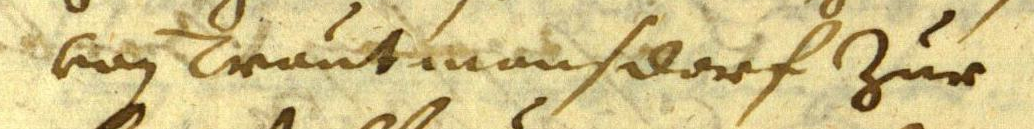von Traūtmansdorf Zur
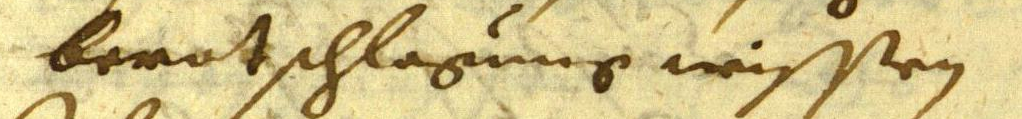beratschlagūng wissen
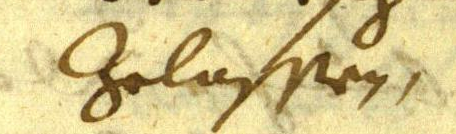Zelassen,
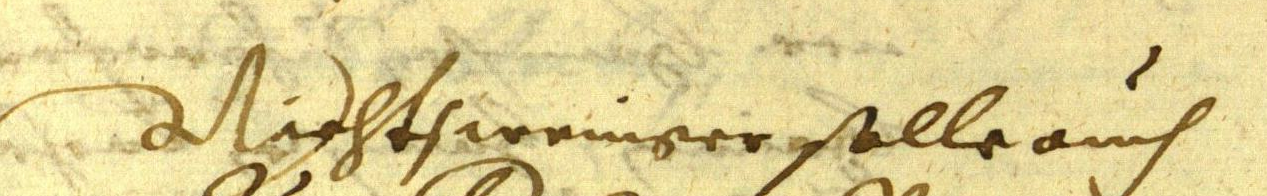Nichts weniger solle aūch
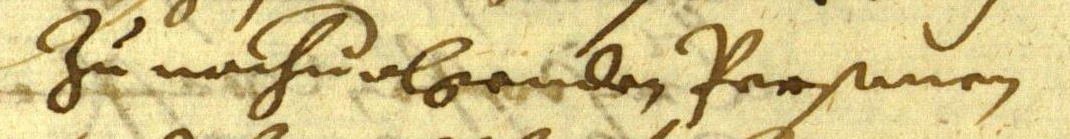Zū nachūolgenden Personen
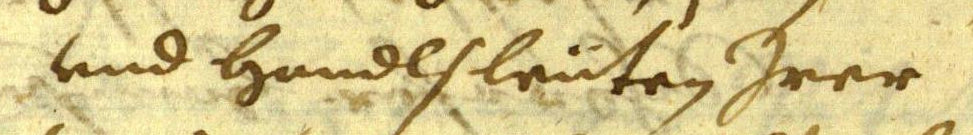vnd Handlsleūten Irer
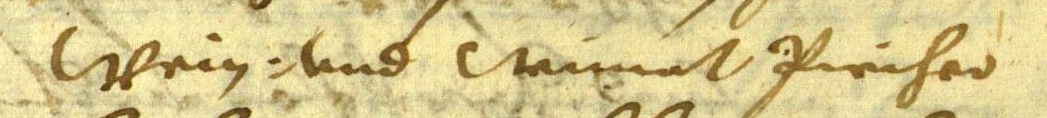Wein: vnd wimat Piecher
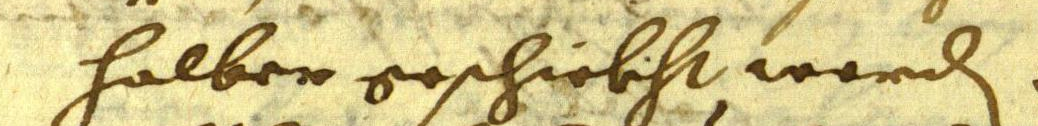halber geschickht werd.
